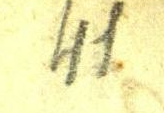41
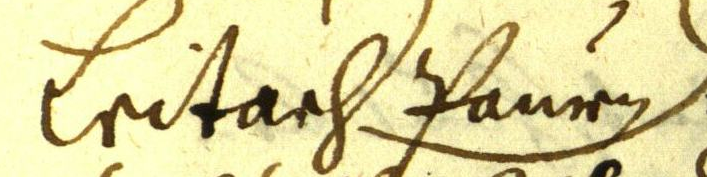Leitach Paūrn
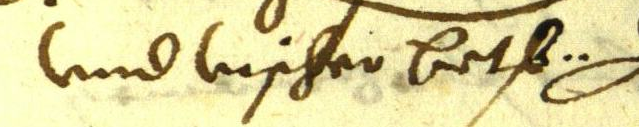vnd vischer bet:
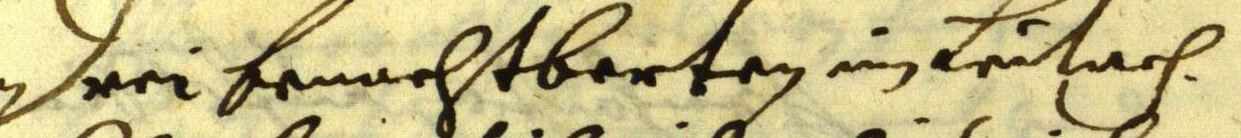Drei benachtberten im Leitach.
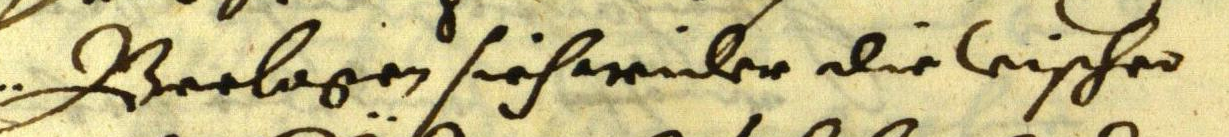Beclagen sich wider die vischer
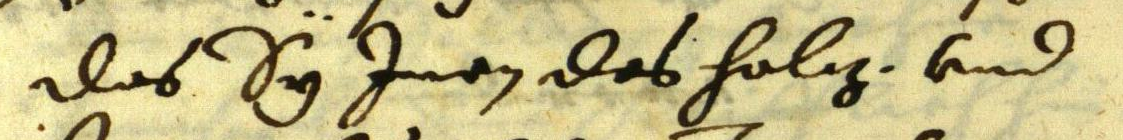Das Sÿ Inen das holz. vnd
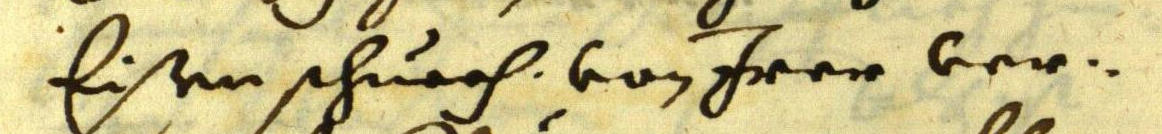Eisen schūech. von Iren ver¬
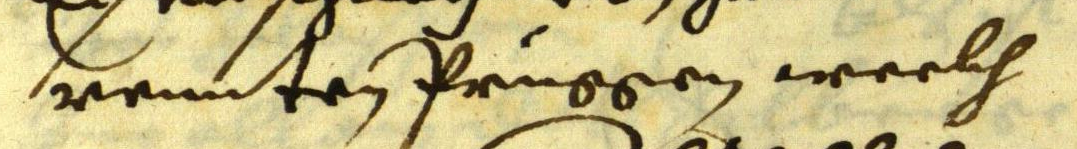rennten Prūggen weckh
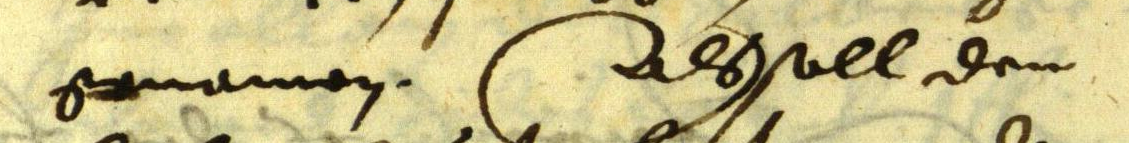genomen. Als soll den
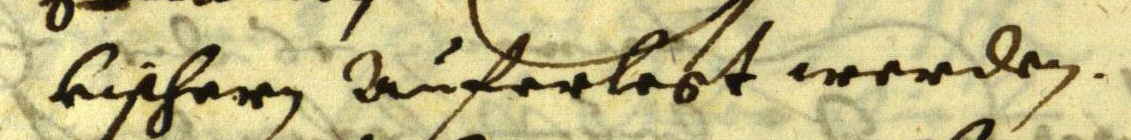vischern Aūferlegt werden.
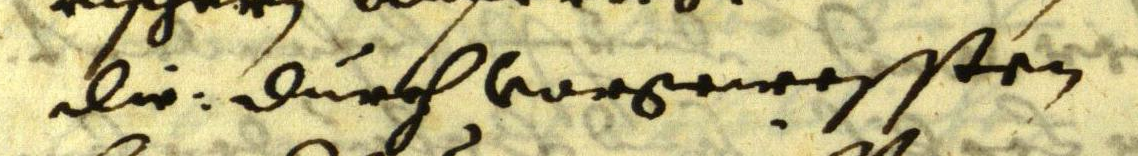die: dūrch vorgewessten
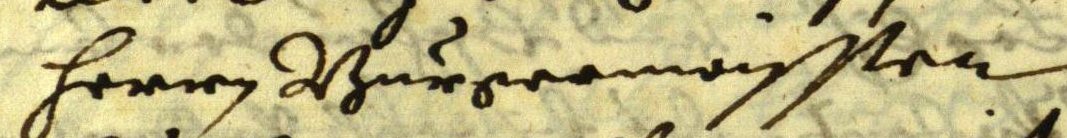herrn Būrgermaisster
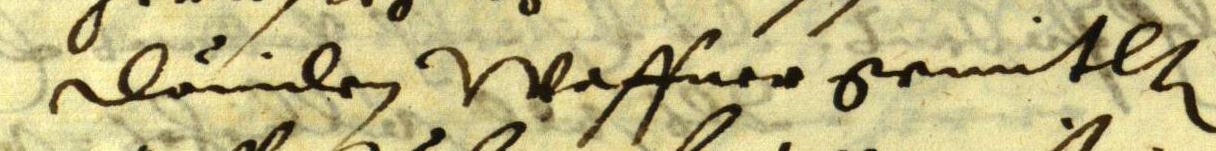Dāuiden Waffner gemitlt
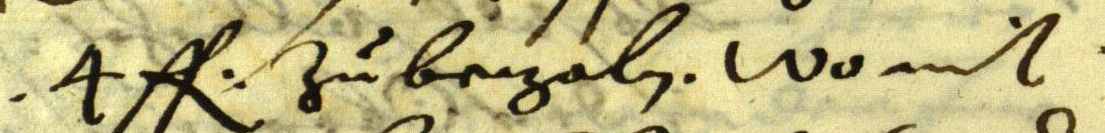.4 fl. Zū bezaln. Wo nit
